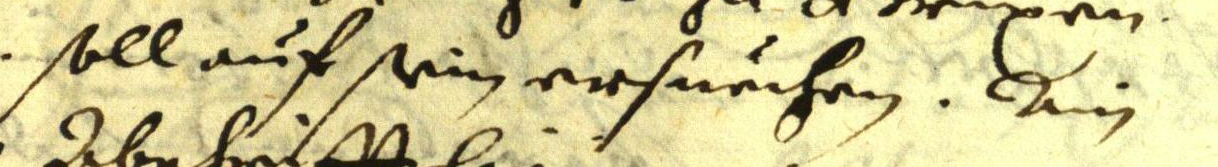soll aūf sein ersūechen. Ain
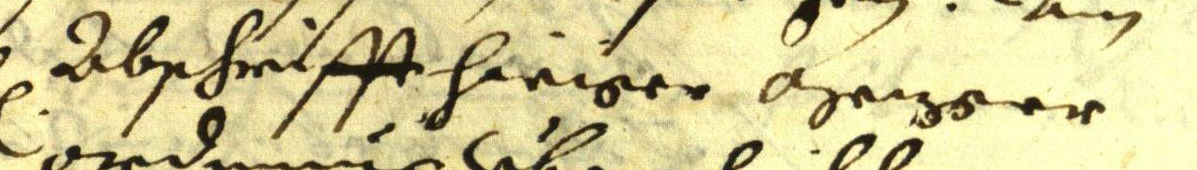Abschrifft hieiger Mezger
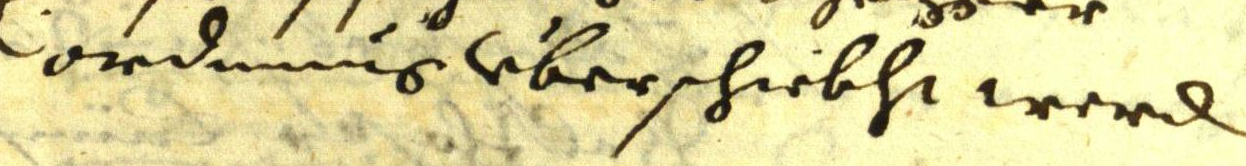ordnūng v̄berschickht werd.
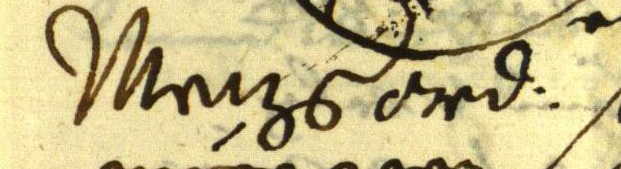Mezg ord¬
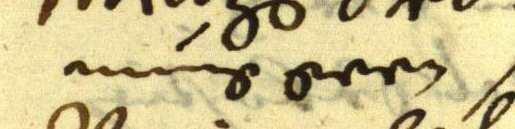nūng geen
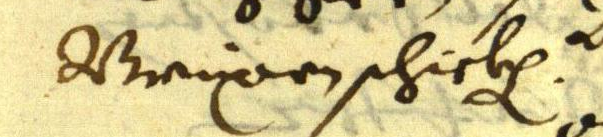Brixen schick.
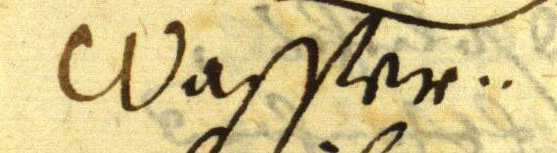Wasser¬
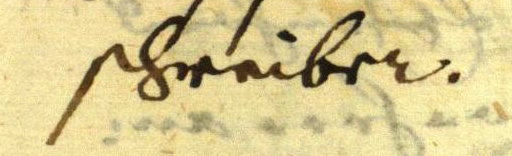schreiber.
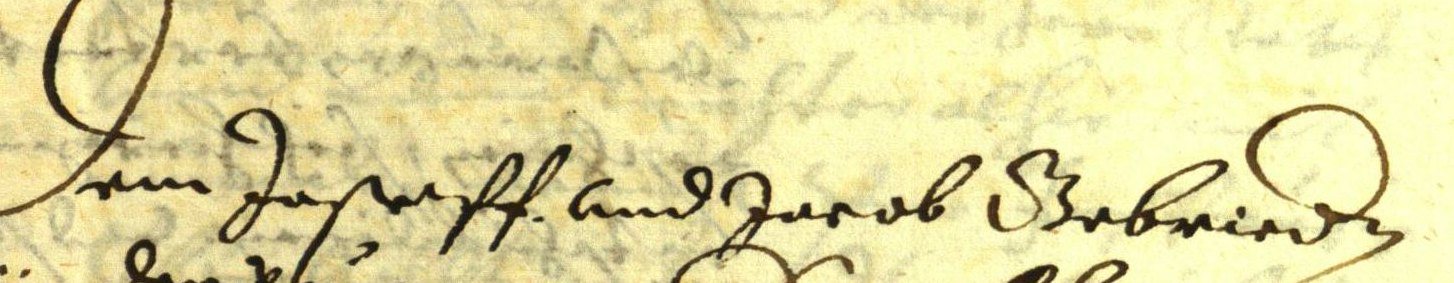Dem Joseff. vnd Jacob Gebriedn
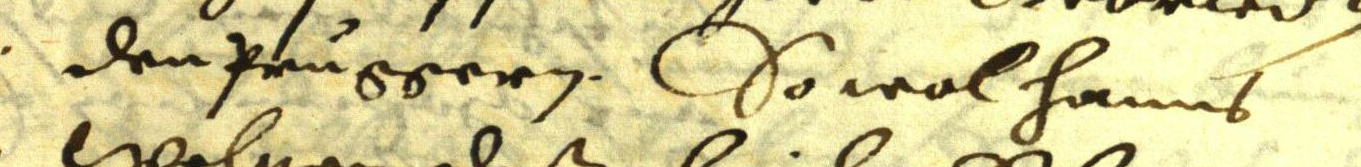den Prūggern. So wol hanns
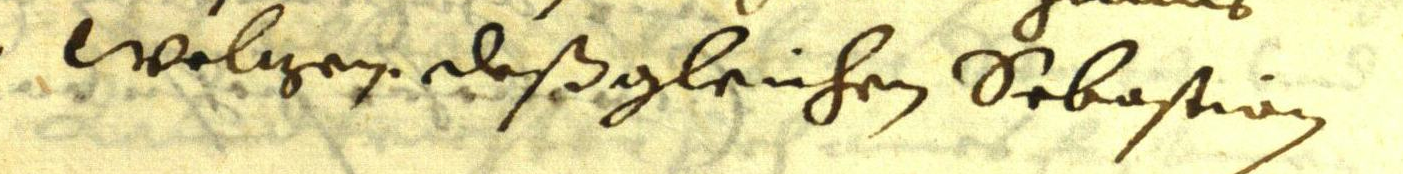Welzen. deßgleichen Sebastian
